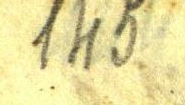145
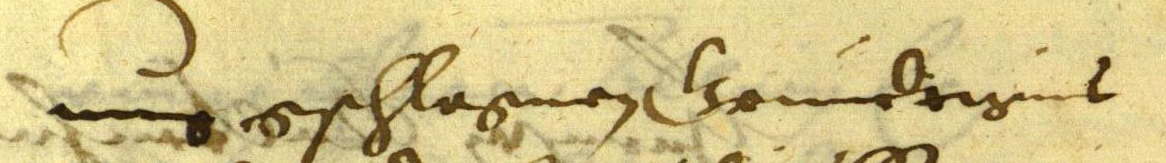ūng gschlagnen Grūndzins
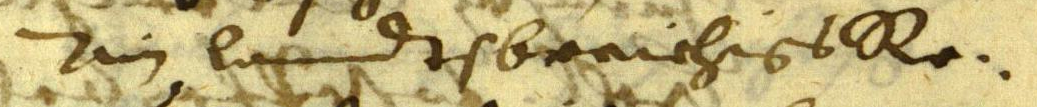Ain lanndtsbreichigs Re¬
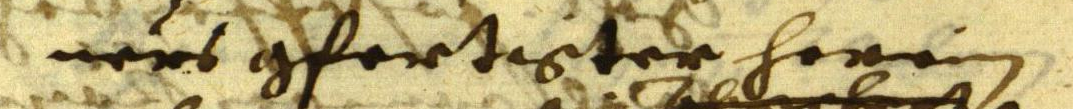vers gfertigter herein
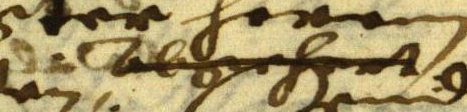: Abgehort
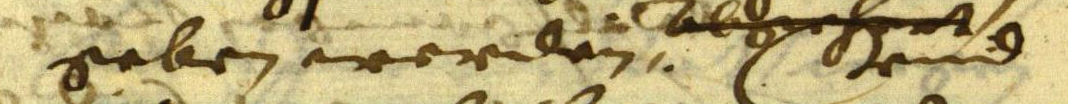geben werden. Vnd
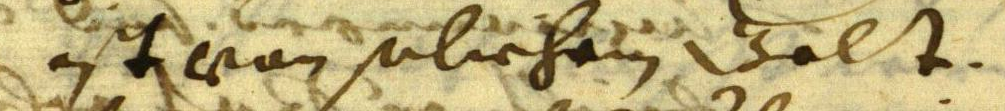ist von solichem Gelt.
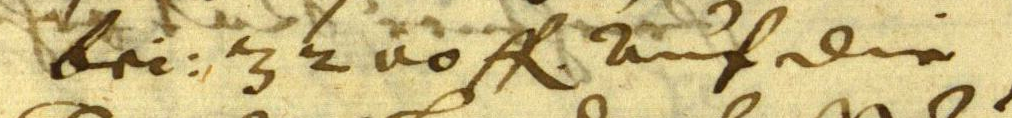bei: 3200 fl. Aūf die
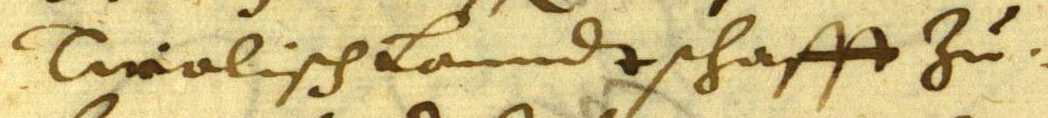Tirolisch Lanndtschafft Zū¬
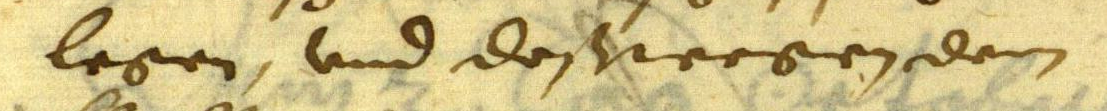legen, vnd deßwegen dem
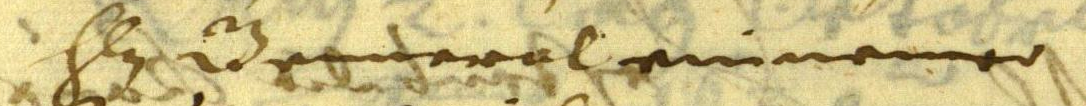hln Genneral einnemer
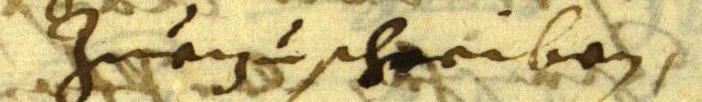Zūezūschreiben,
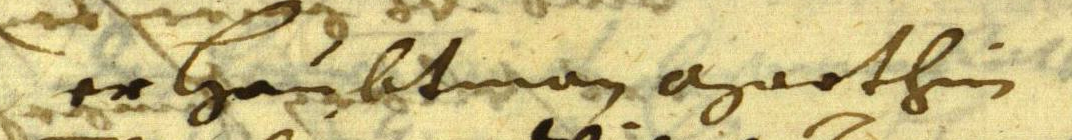Der Haūbtman Marthin
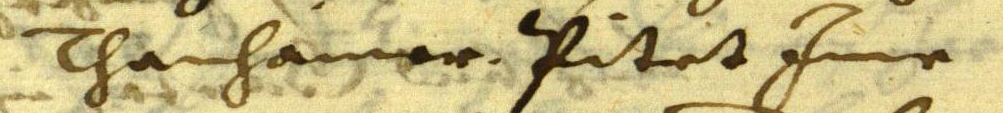Thanhaimer. Pitet Ime
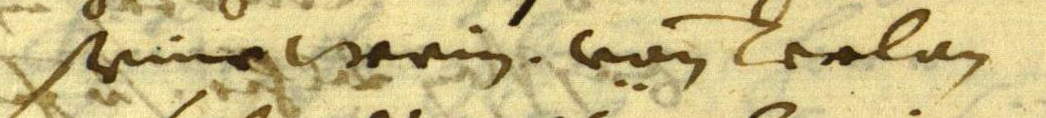seine wein. von Terlan
